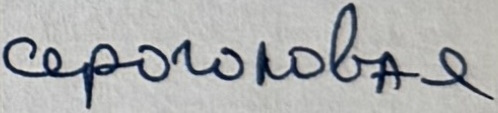сероголовая
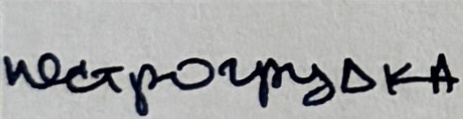пестрогрудка
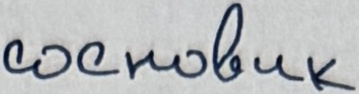сосновик
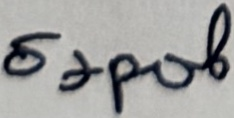бэров
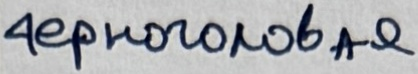черноголовая
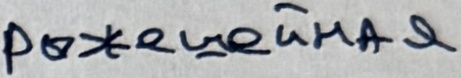рыжешейная
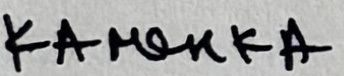каменка
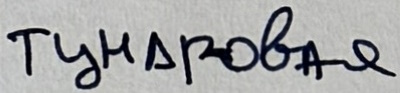тундровая
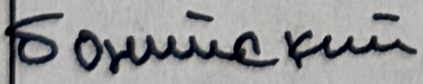бонийский
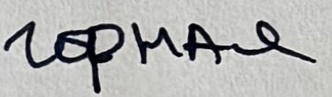горная
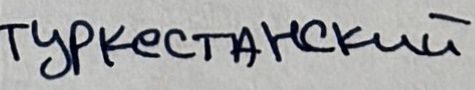туркестанский
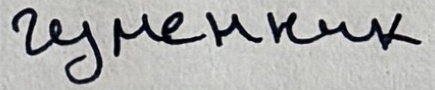гуменник
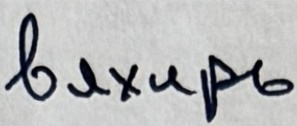вяхирь
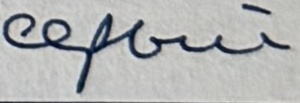серый
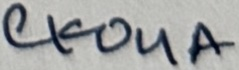скопа
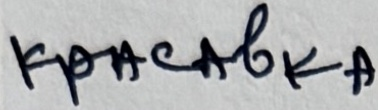красавка
